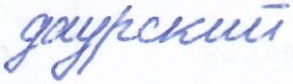даурский
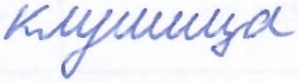клушица
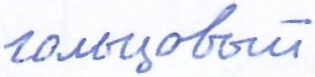гольцовый
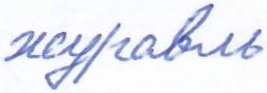журавль
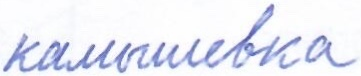камышевка
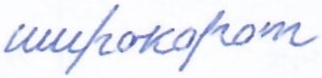широкорот
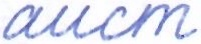аист
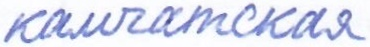камчатская
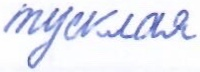тусклая
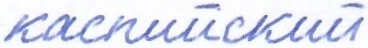каспийский
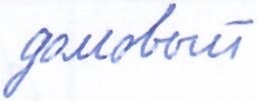домовый
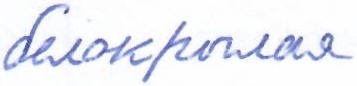белокрылая
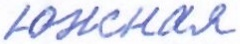южная
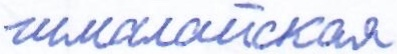гималайская
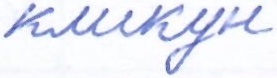кликун
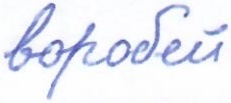воробей
